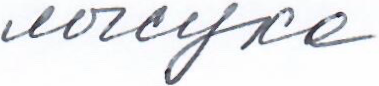лысуха
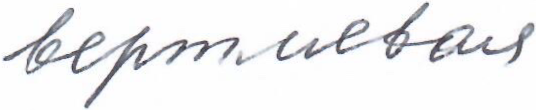вертлявая
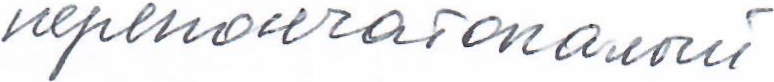перепончатопалый
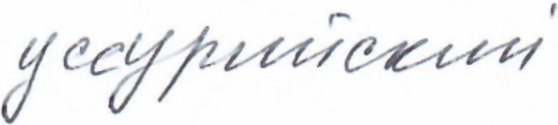уссурийский
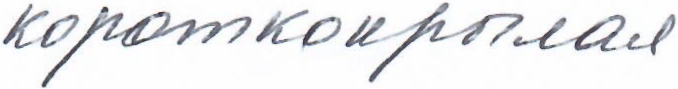короткокрылая
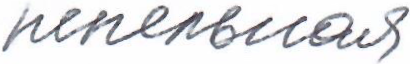пепельная
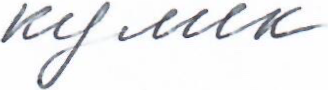кулик
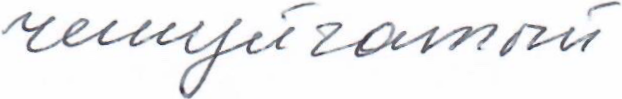чешуйчатый
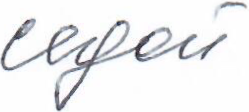седой
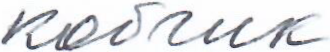кобчик
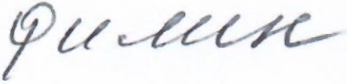филин
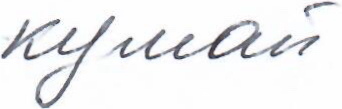кумай
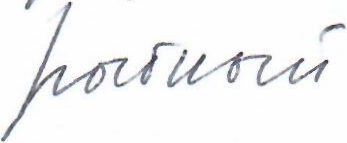рыбный
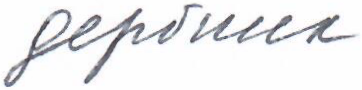дербник
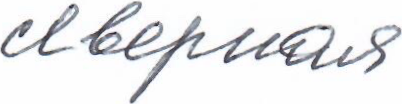северная
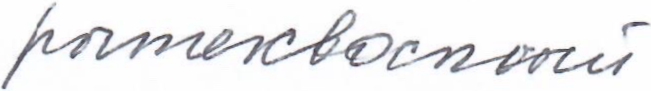рыжехвостый
